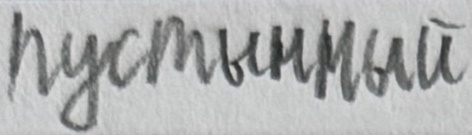пустынный
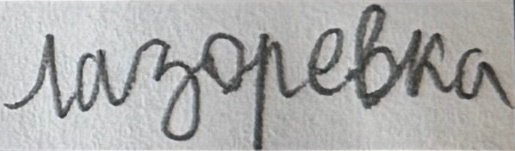лазоревка
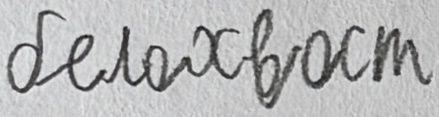белохвост
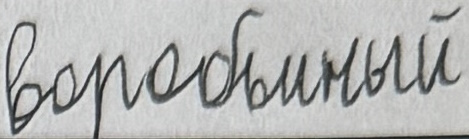воробьиный
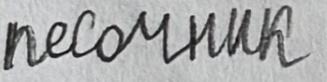песочник
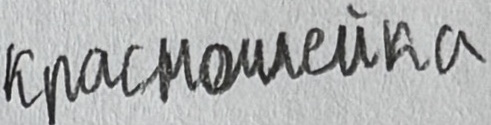красношейка
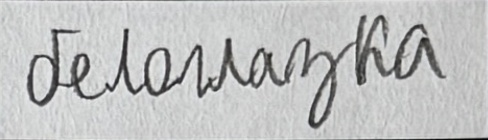белоглазка
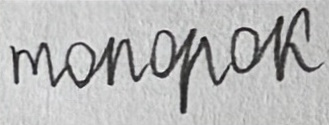топорок
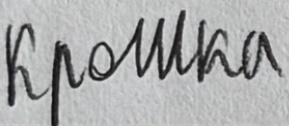крошка
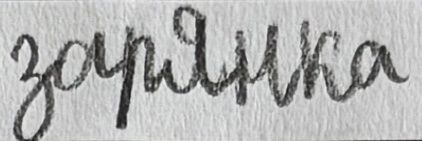зарянка
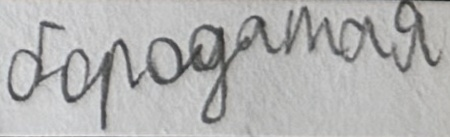бородатая
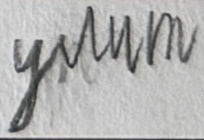улит
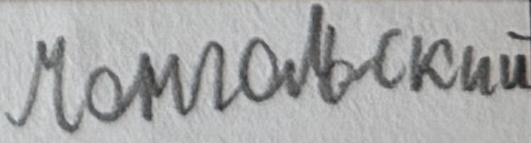монгольский
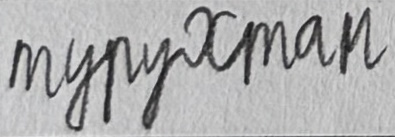турухтап
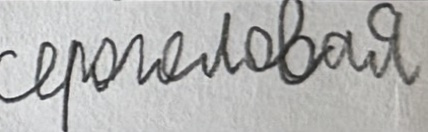сероголовая
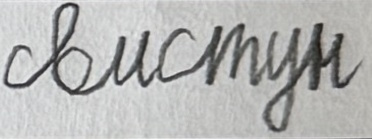свистун
